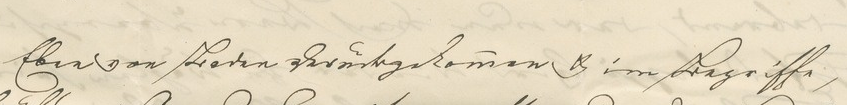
Eben von Baden zurückgekommen & im Begriffe,
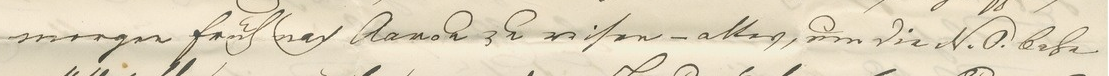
morgen früh nach Aarau zu reisen – alles, um die N.O.bahn-
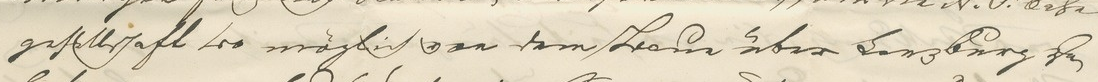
gesellschaft wo möglich von dem Baue über Lenzburg zu
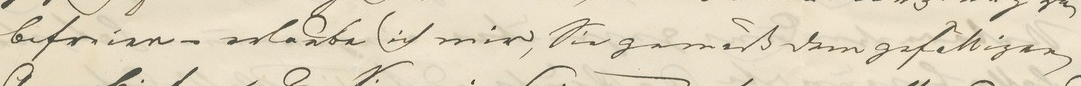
befreien – erlaube ich mir, Sie gemäß dem gefälligen
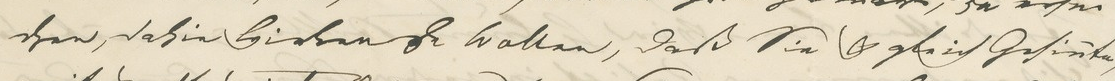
chen, dahin wirken zu wollen, daß Sie & gleich Gesinnte,
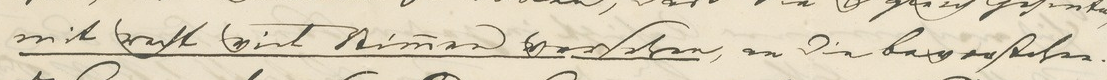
mit recht viel Stimmen versehen, an die bevorstehen-
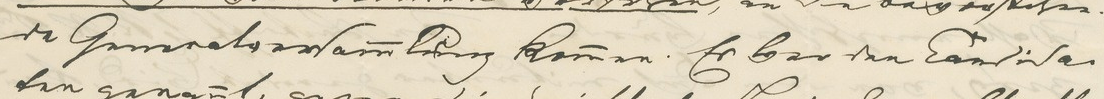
de Generalversammlung kommen. Es werden Candida-
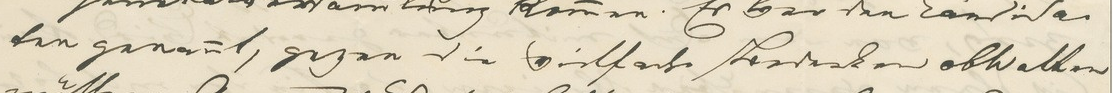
ten genannt, gegen die vielfache Bedenken obwalten
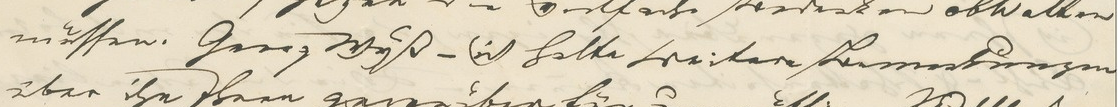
müssen. Georg Wyß – ich halte weitere Bemerkungen
